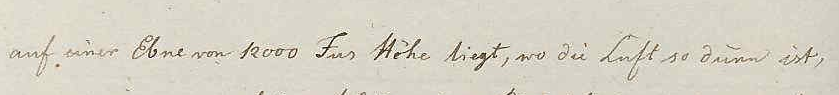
auf einer Ebne von 12000 Fus Höhe liegt, wo die Luft so dünn ist,
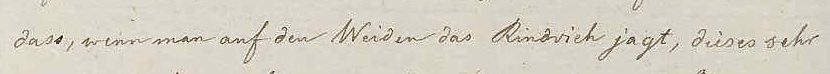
dass, wenn man auf den Weiden das Rindvieh jagt, dieses sehr
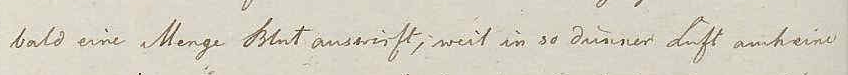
bald eine Menge Blut auswirft, weil in so dünner Luft auch eine
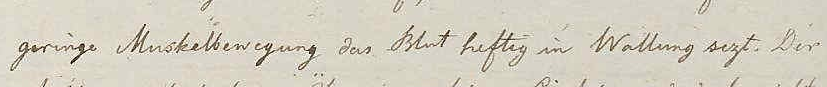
geringe Muskelbewegung das Blut heftig in Wallung sezt. Der
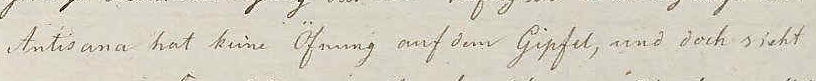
Antisana hat keine Öfnung auf dem Gipfel, und doch sieht
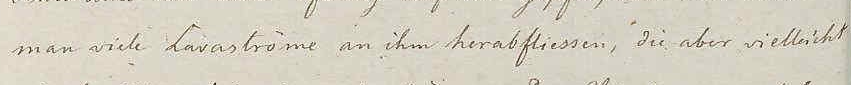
man viele Lavaströme an ihm herabfliessen, die aber vielleicht
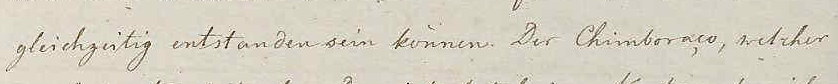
gleichzeitig entstanden sein können. Der Chimboraço, welcher
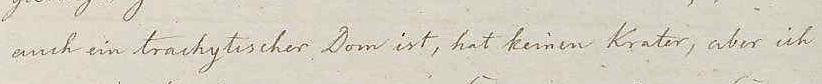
auch ein trachytischer Dom ist, hat keinen Krater, aber ich
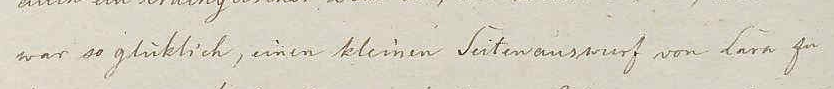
war so glücklich, einen kleinen Seitenauswurf von Lava zu
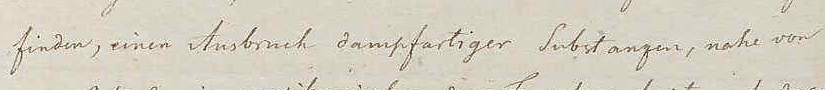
finden, einen Ausbruch dampfartiger Substanzen, nahe von
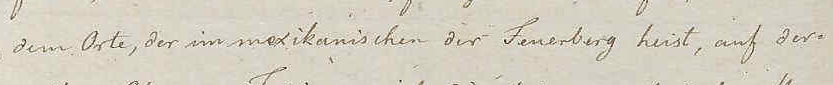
dem Orte, der im mexikanischen der Feuerberg heist, auf der-
